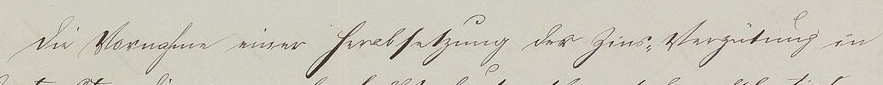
Die Vornahme einer Herabsetzung der Zins-Vergütung in
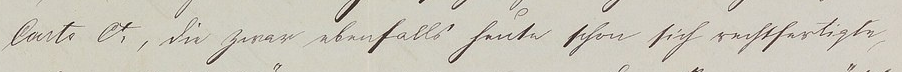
Conto Ct, die zwar ebenfalls heute schon sich rechtfertigte,
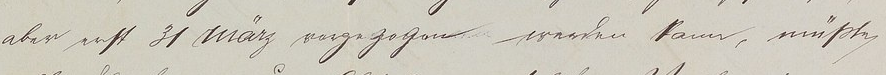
aber erst 31 März vorgezogen werden kann, müßte
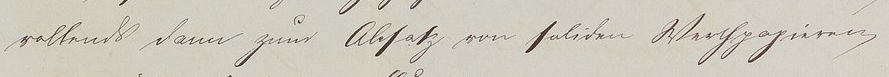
vollends dann zum Absatz von soliden Werthpapieren
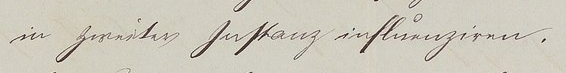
in zweiter Instanz influenziren.
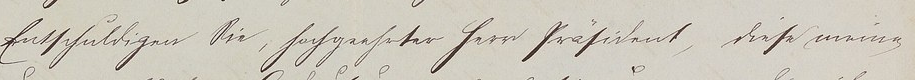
Entschuldigen Sie, hochgeehrter Herr Präsident, diese meine
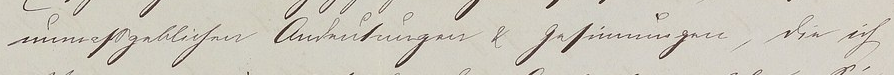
unmaßgeblichen Andeutungen & Gesinnungen, die ich
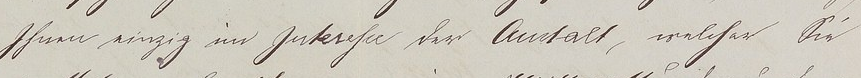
Ihnen einzig im Interesse der Anstalt, welcher Sie
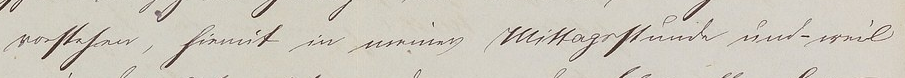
vorstehen, hiemit in meiner Mittagsstunde und – weil
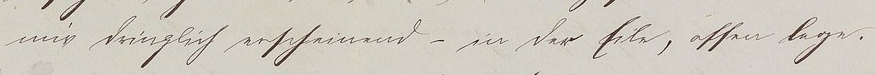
mir dringlich erscheinend – in der Eile, offen lege.
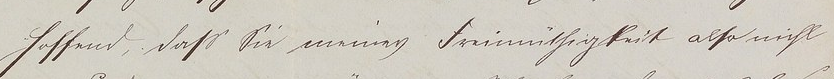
Hoffend, daß Sie meiner Freimüthigkeit also nicht
